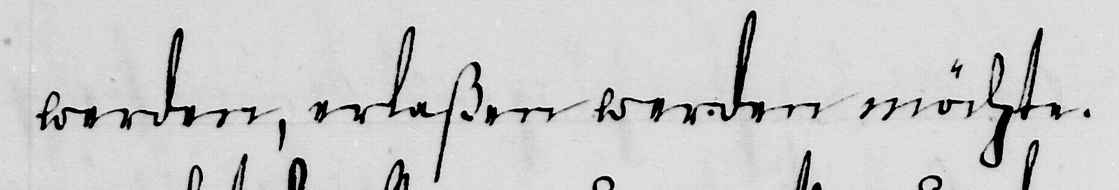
werden, erlaßen werden möchte.
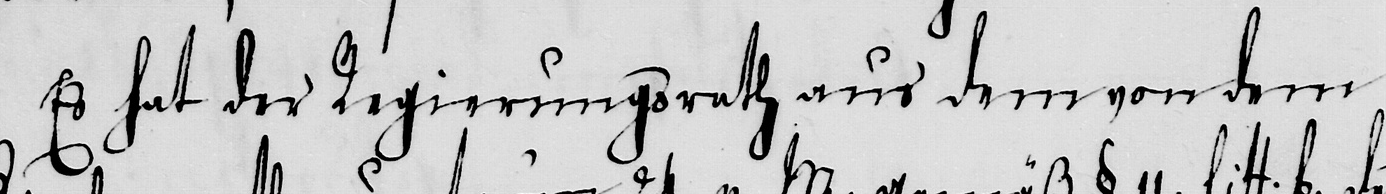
Es hat der Regierungsrath aus dem von dem
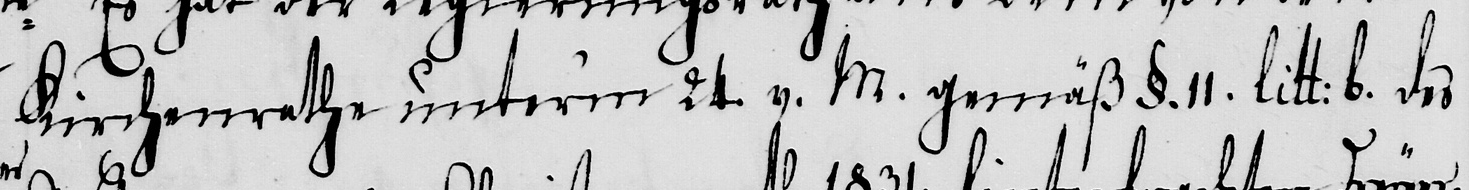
Kirchenrathe unterm 24. v. M. gemäß §. 11. litt: b.
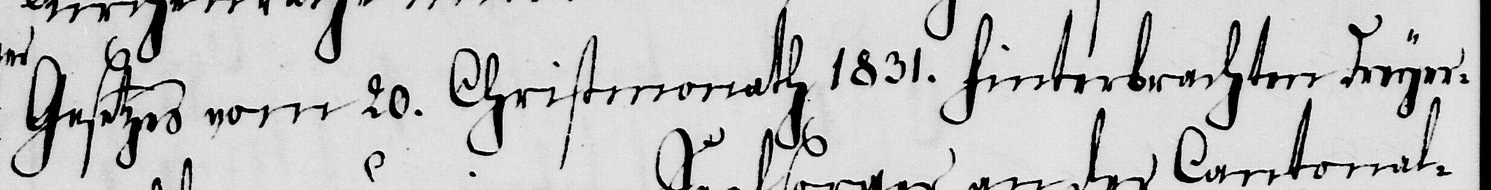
Gesetzes vom 20. Christmonath 1831. hinterbrachten Dreyer¬
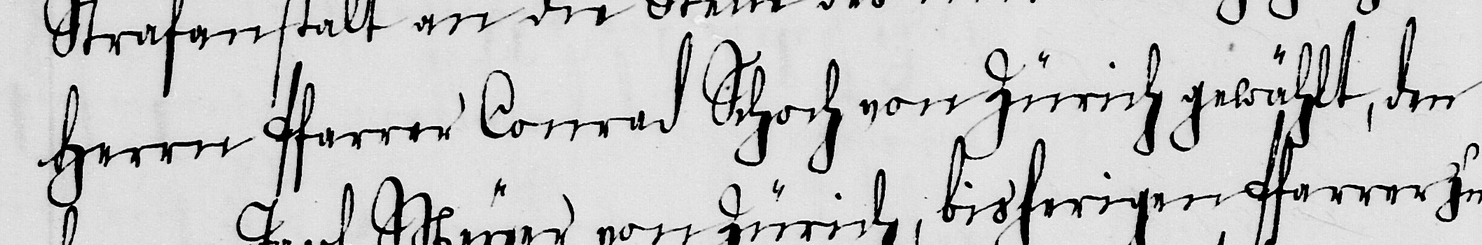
Herrn Pfarrer Conrad Schoch von Zürich gewählt, den
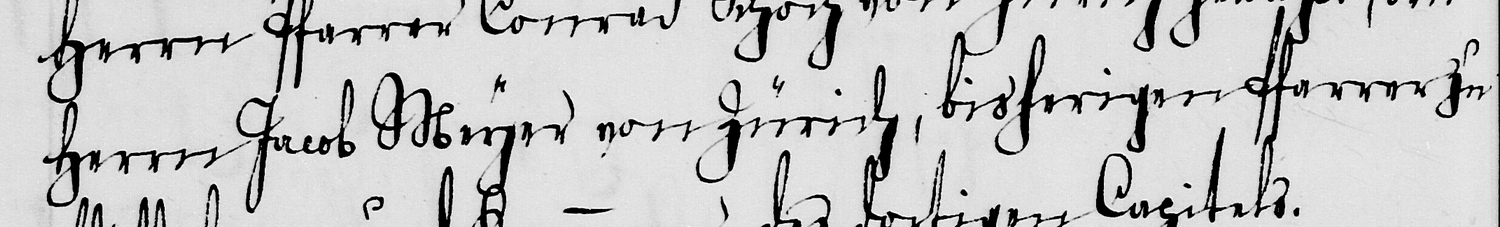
Herrn Jacob Meyer von Zürich, bisherigen Pfarrer zu
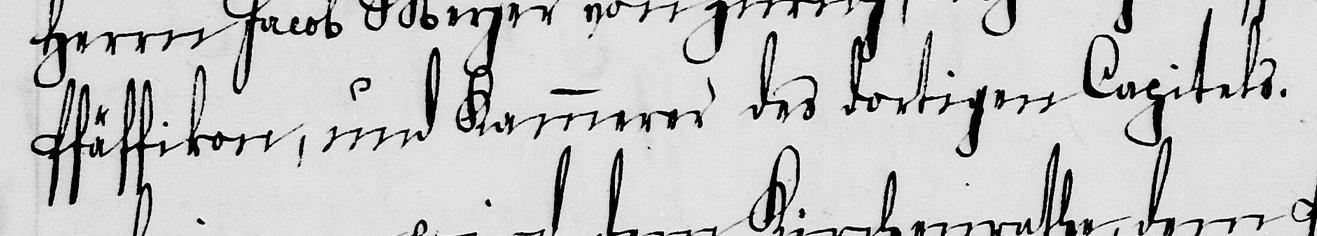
Pfäffikon, und Kammerer des dortigen Capitels.
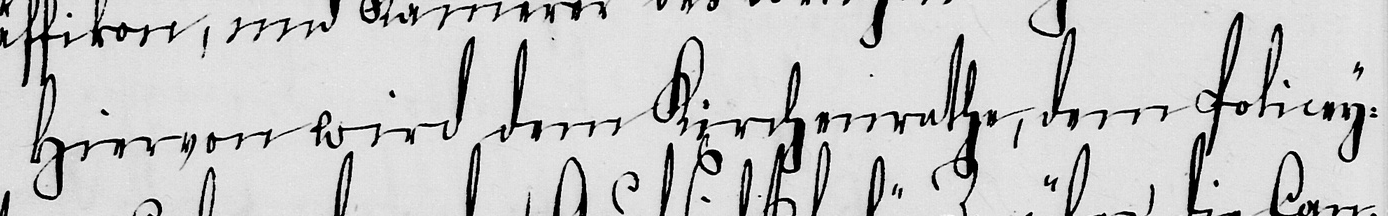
Hiervon wird dem Kirchenrathe, dem Policey¬
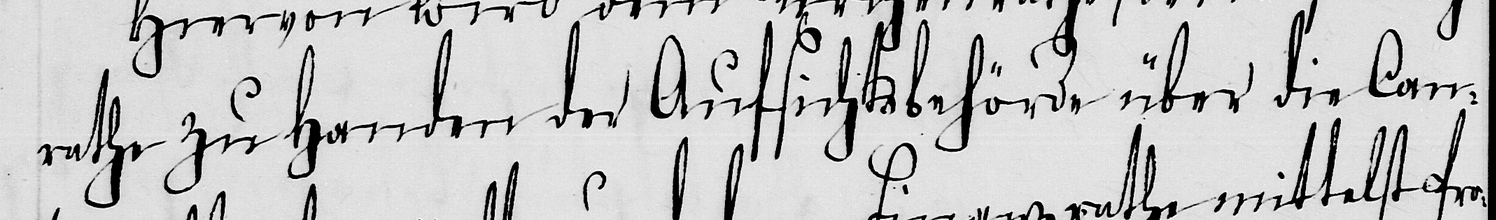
rathe zu Handen der Aufsichtsbehörde über die Can¬
